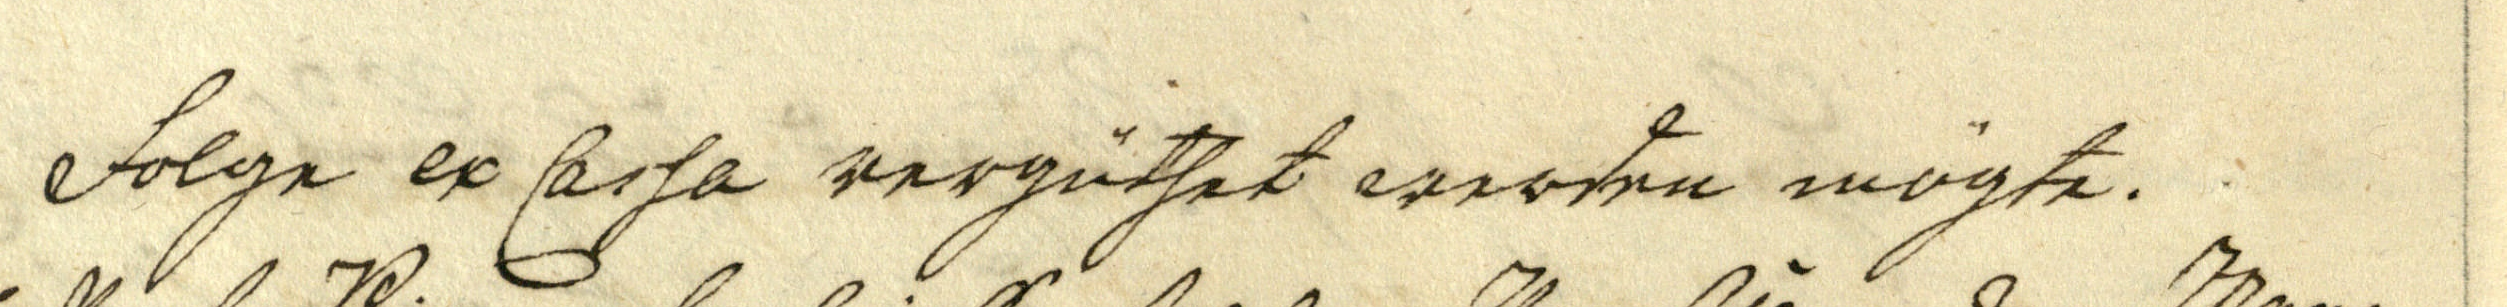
Folge er Cassa vergüthet werden mögte.
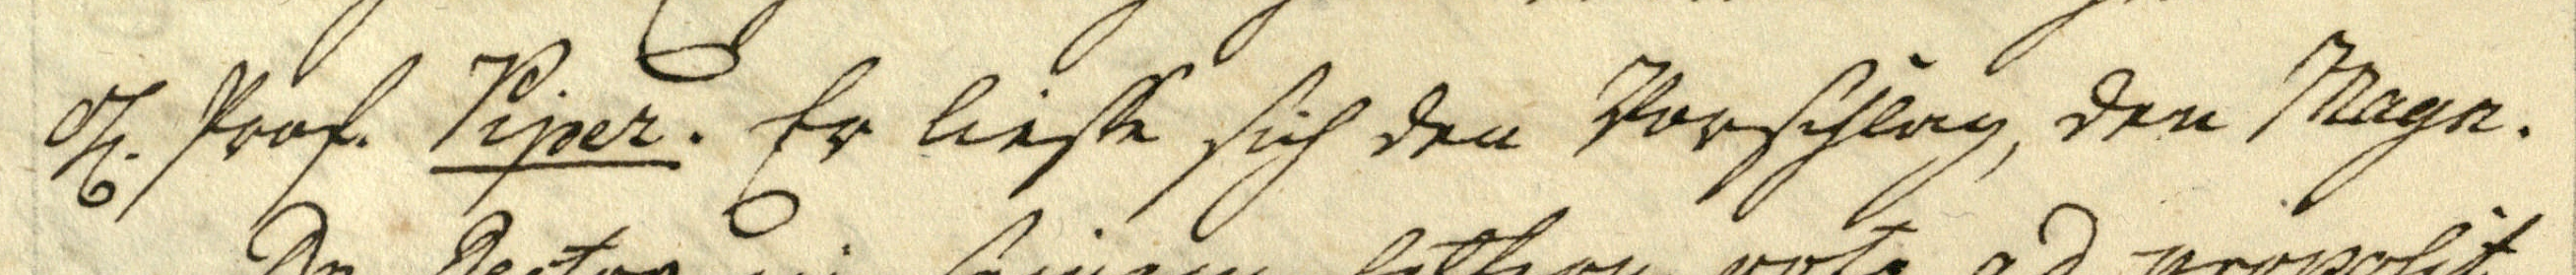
dh. Prof. Piper. Er liesse sich den Vorschlag, den Magn.
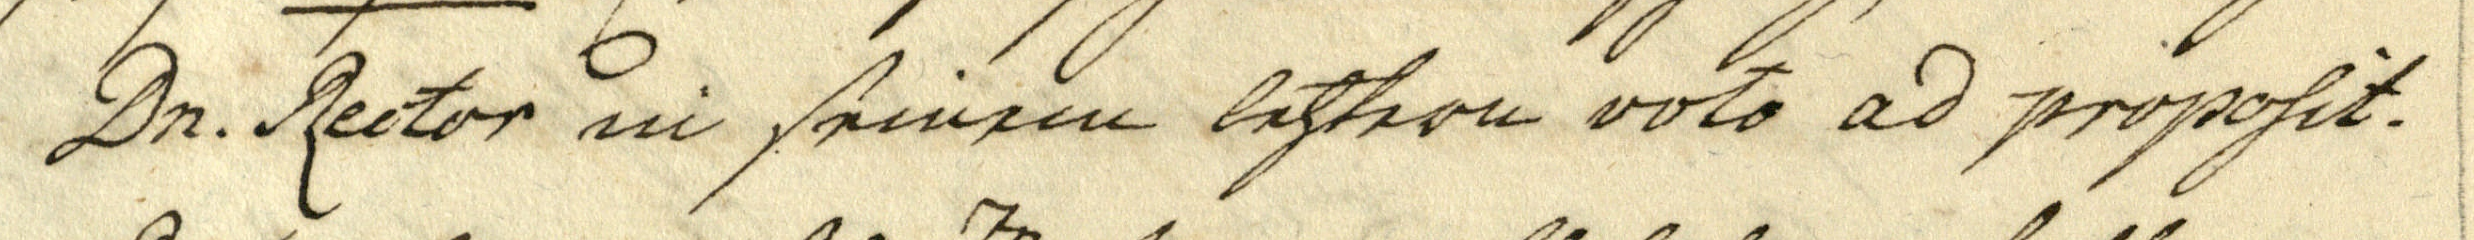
Dn. Rector in seinem letztern voto ad proposit.
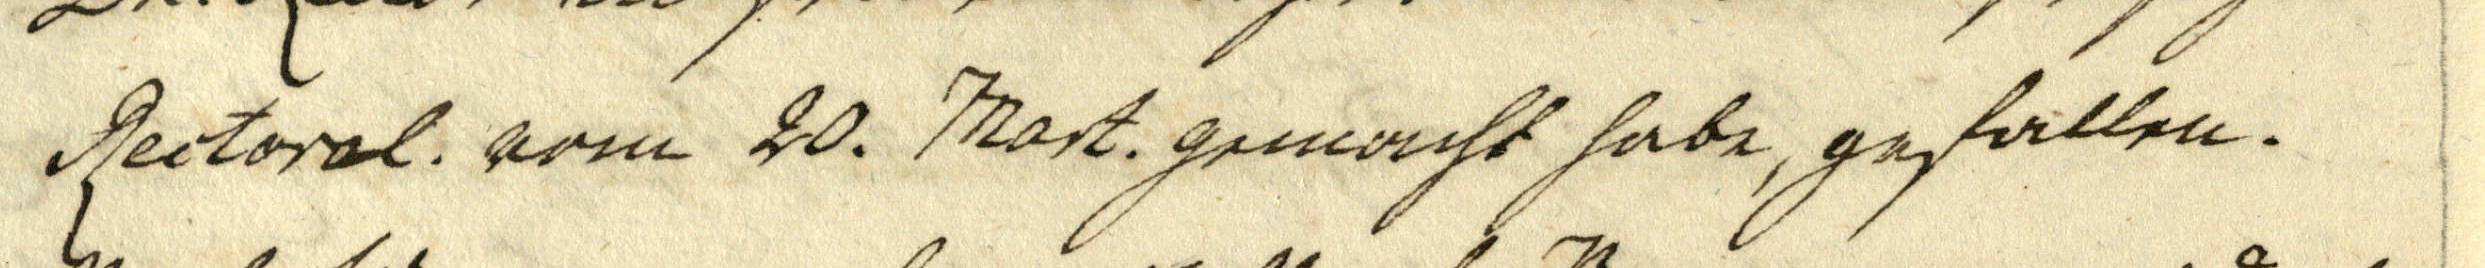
Rectoral. vom 20. Mart. gemacht habe, gefallen.
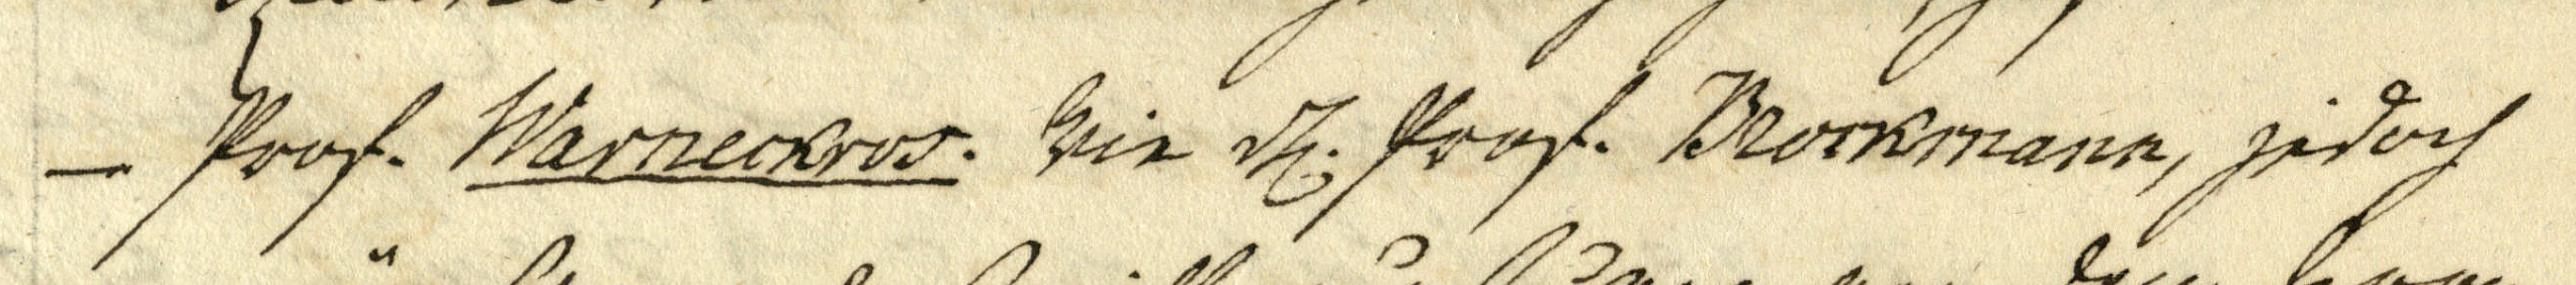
Prof. Warneckros. Wie dh. Prof. Brockmann, jedoch
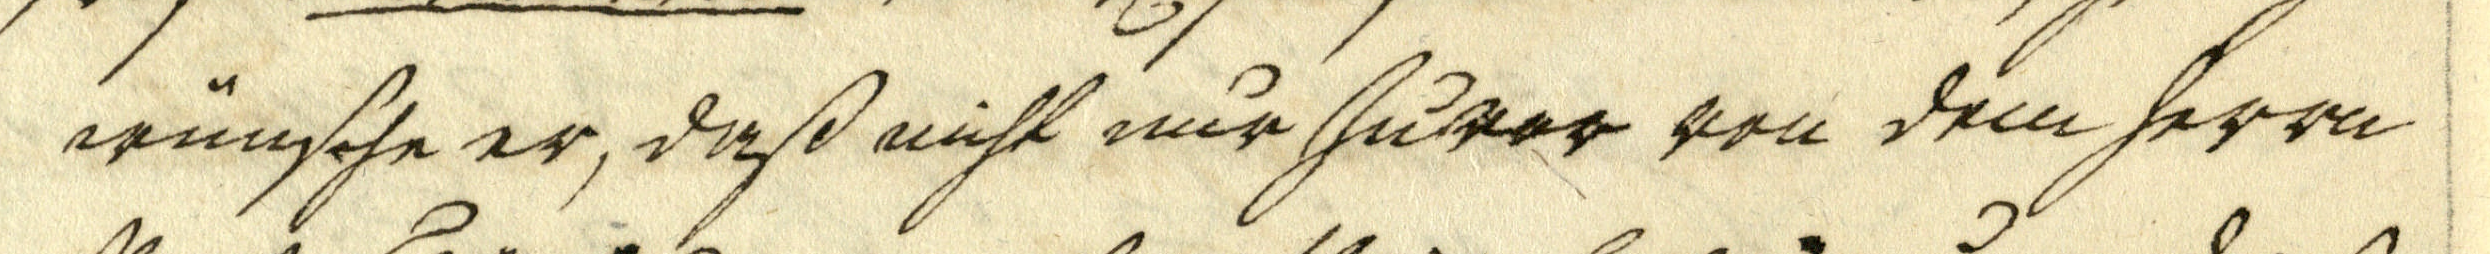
wünsche er, daß nicht nur zuvor von dem Herrn
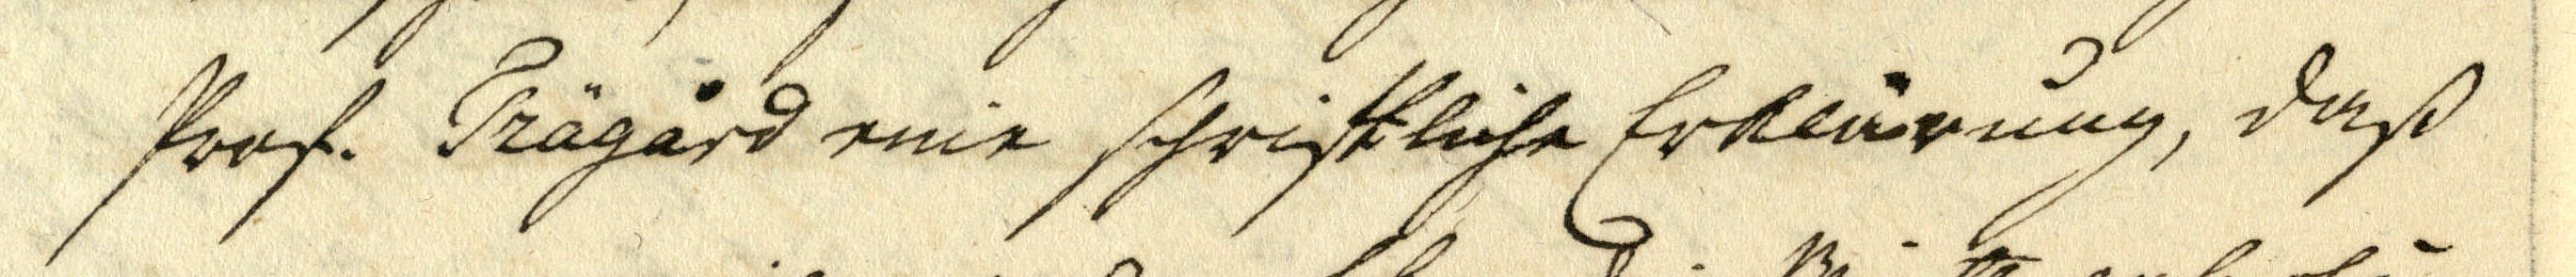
Prof. Trägård eine schriftliche Erklärung, daß
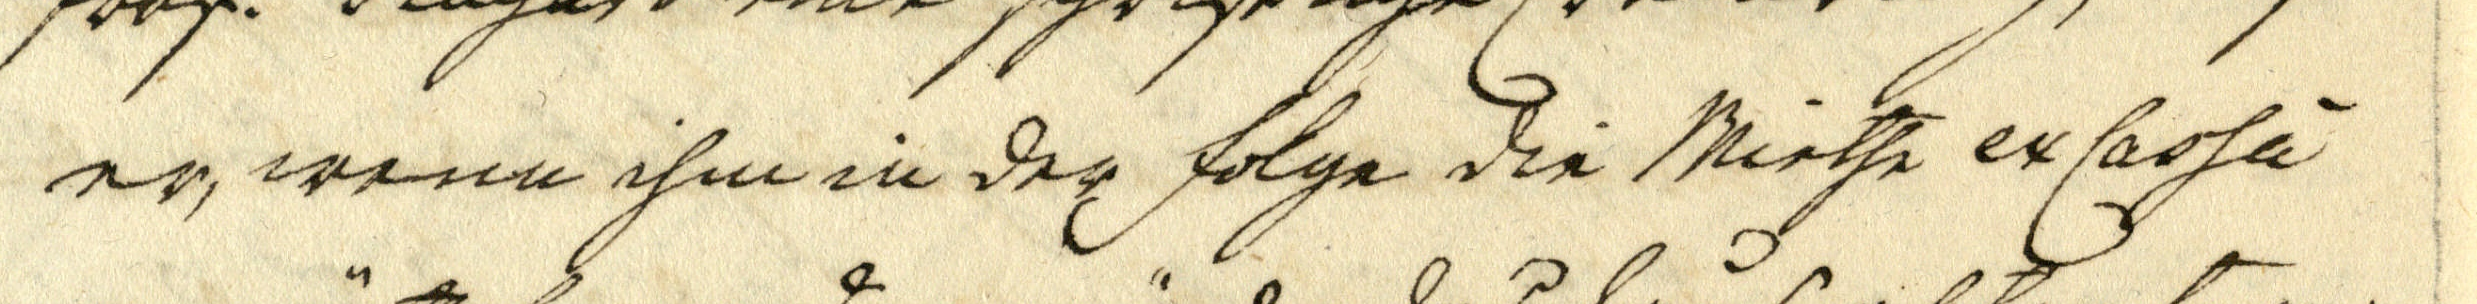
er, wenn ihm in der Folge die Miethe ex Cassa
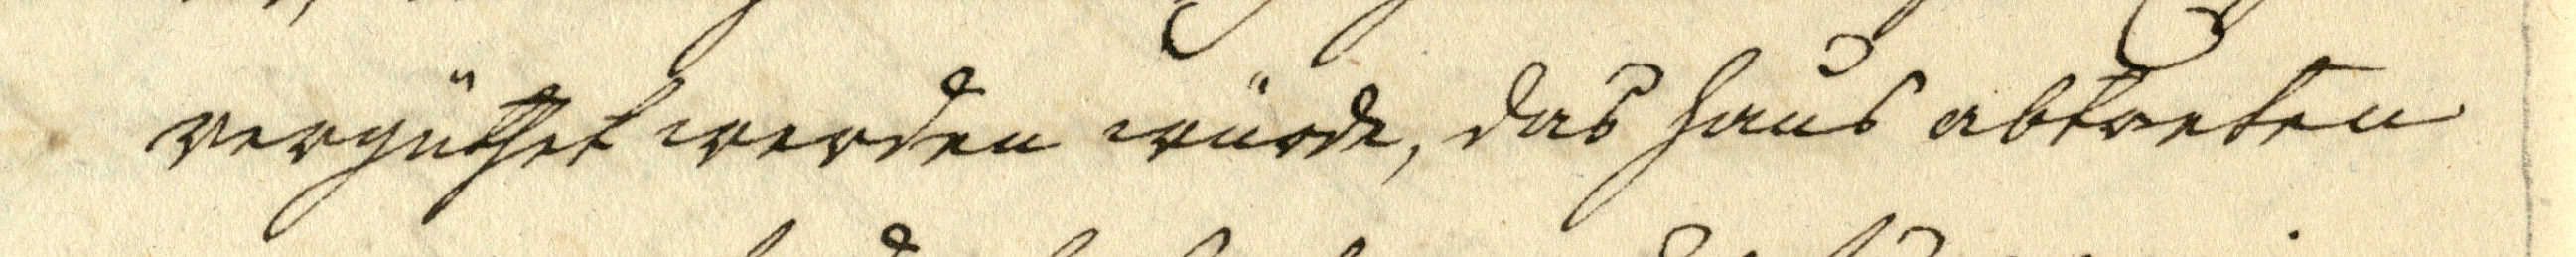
vergüthet werden würde, das Haus abtreten
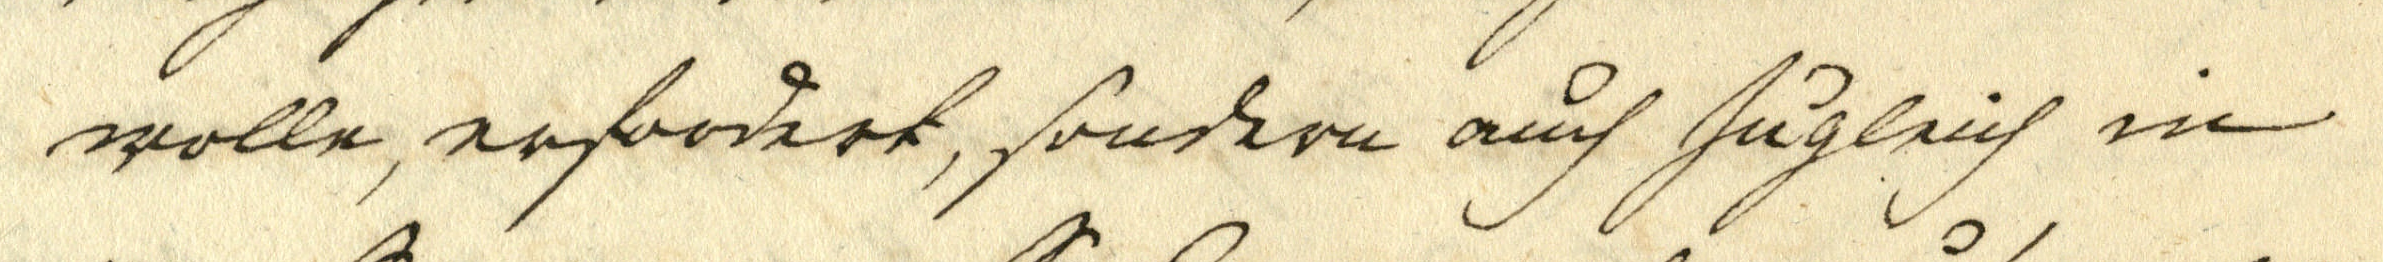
wolle, erfordert, sondern auch zugleich in
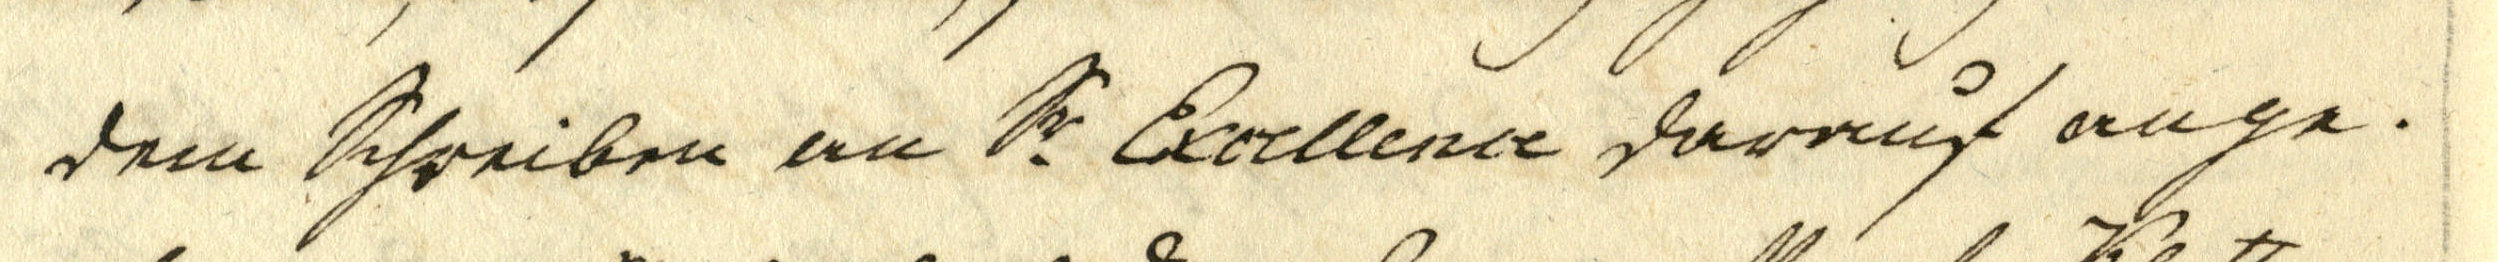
dem Schreiben an Sr Excellence darauf ange¬
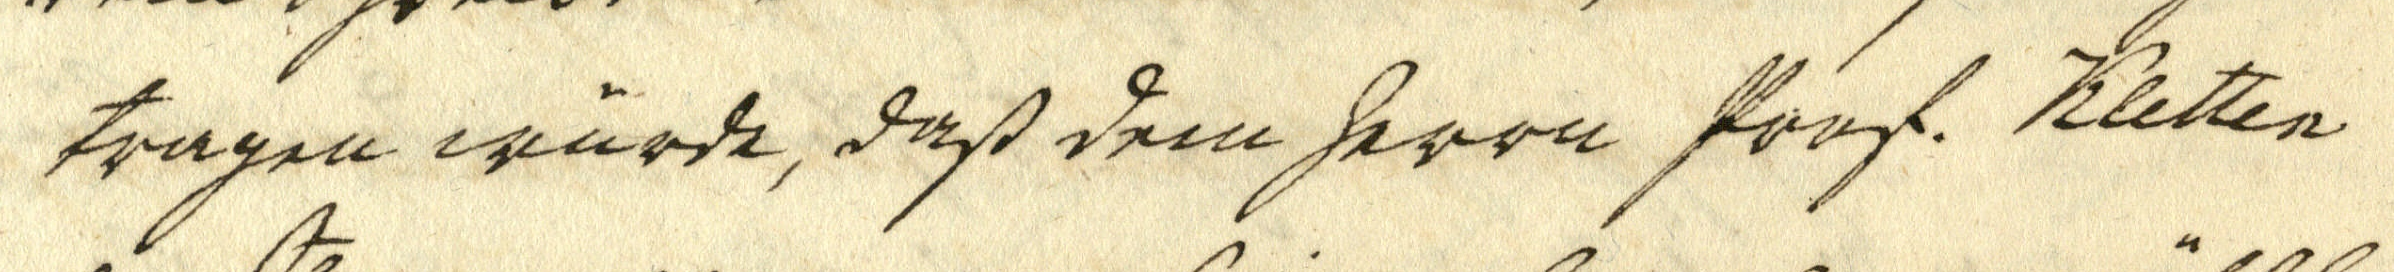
tragen würde, daß dem Herrn Prof. Kletten
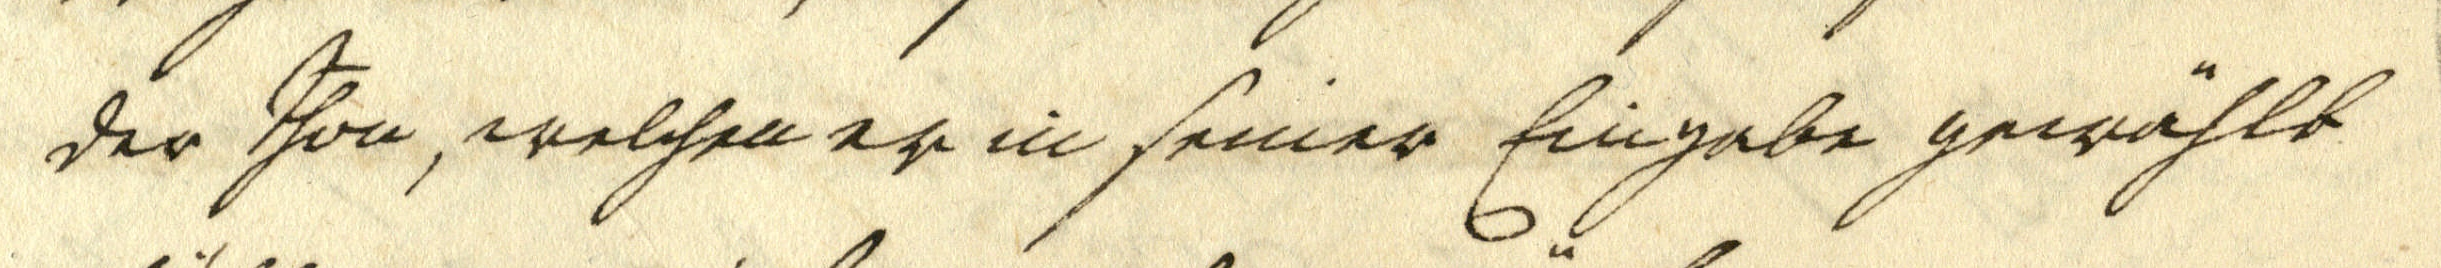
der Thon, welchen er in seiner Eingabe gewählt
